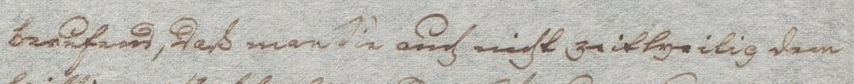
berufend, daß man Sie auch nicht zeitweilig dem
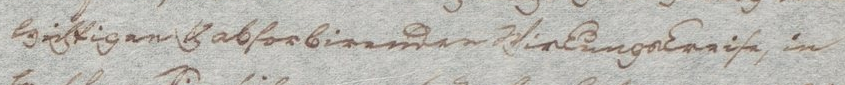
wichtigen & absorbirenden Wirkungskreise, in
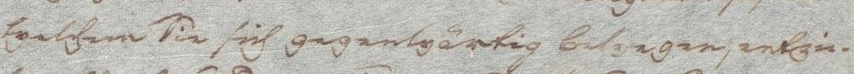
welchem Sie sich gegenwärtig bewegen, entzie-
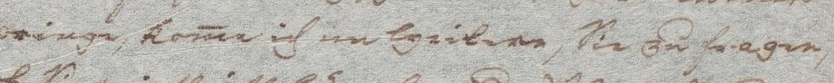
bringe, komme ich im weitern, Sie zu fragen,
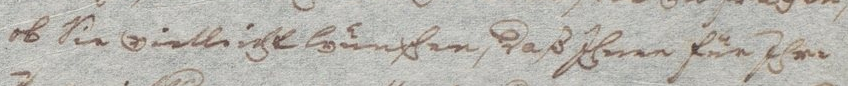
ob Sie vielleicht wünschen, daß Ihnen für Ihre
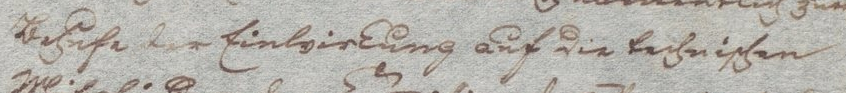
Behufe der Einwirkung auf die technischen
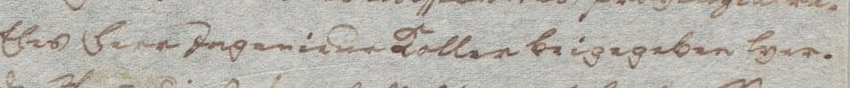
thes Herr Ingenieur Koller beigeeben wer-
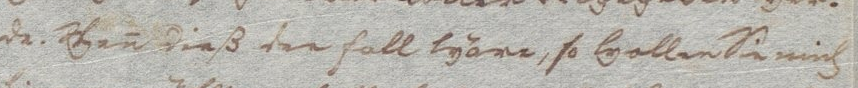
de. Wenn dieß der Fall wäre, so wollen Sie mich
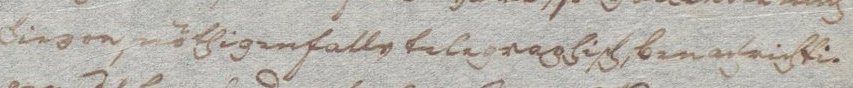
hievon, nöthigenfalls telegraphisch, benachrichti-
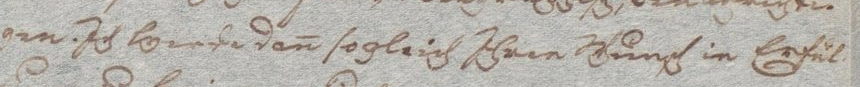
gen. Ich werde dann sogleich Ihren Wunsch in Erfül-
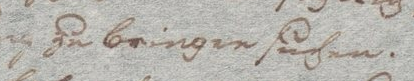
lung zu bringen suchen.
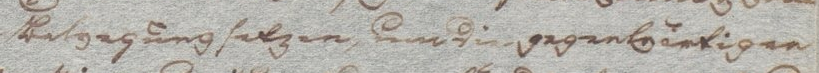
Bewegung setzen, um die gegenwärtigen
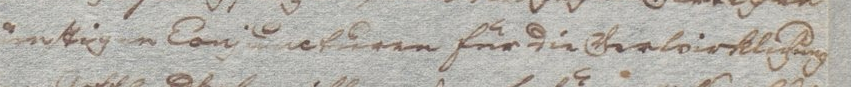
günstigen Conjuncturen für die Verwirklichung
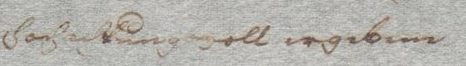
hochachtungsvoll ergebene
